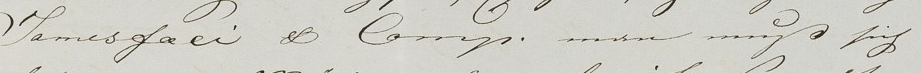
James Faci & Comp. man muß sich
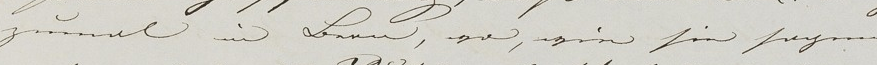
zumal in Bern, wo, wie sie sagen,
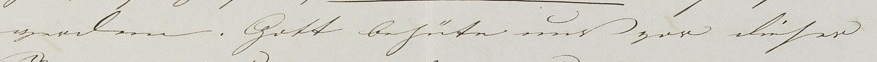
werden. Gott behüte uns vor diser
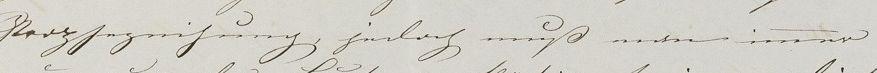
Prophezeihung, jedoch muß man immer
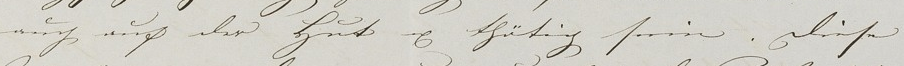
auch auf der Hut & thätig sein. Diese
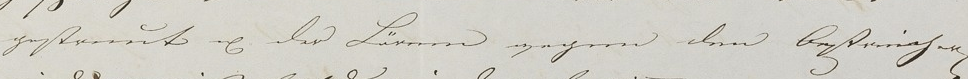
gestreut & der Lärmen wegen den Oestreichern
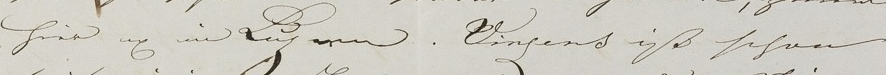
hier & in Luzern. Vinzens ist schon
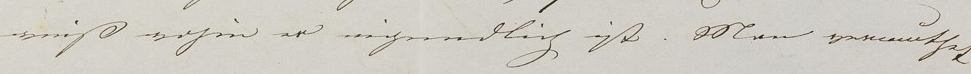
weiß wohin er eigendlich ist. Man vermuthet
